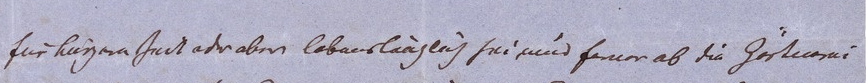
für kürzere Zeit oder aber lebenslänglich sei und ferner ob die Gärtnerei
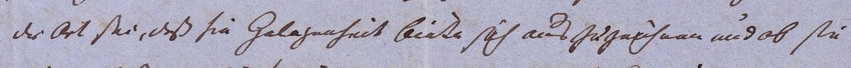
der Art sei, daß sie Gelegenheit biete, sich auszuzeichnen und ob sie
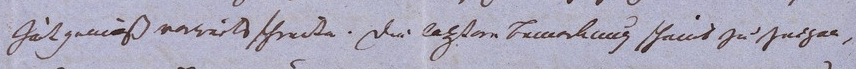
Zeitgemäß vowärts schreite. Die letztere Bemerkung scheint zu sagen,
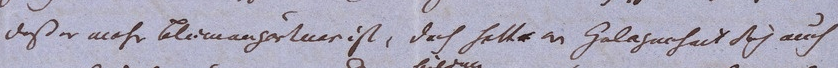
daß er mehr Blumengärtner ist, doch hatte er Gelegenheit sich auch
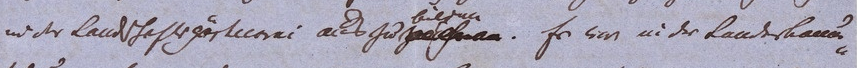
in der Landschaftsgärtnerei auszuzeichnenbilden. Er war in der Landesbaum-
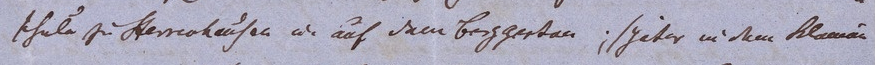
schule zu Herrenhausen u. auf dem Berggarten; später in dem kleinen
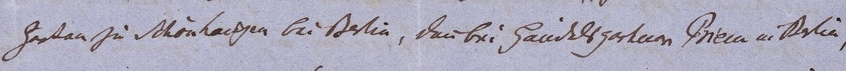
Garten zu Schönhausen bei Berlin, dann bei Handelsgartner Priem in Berlin,
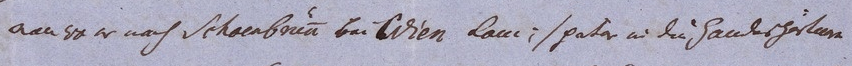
von wo er nach Schoenbrunn bei Wien kam; später in die Handelsgärtnerei
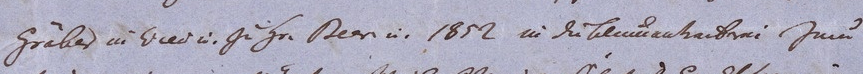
Gräber in Wien u. zu Hr. Beer u. 1852 in die Blumentreiberei zum
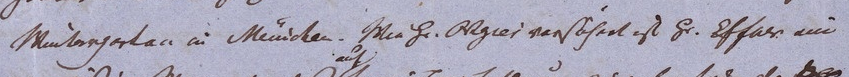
Wintergarten in München. Wie Hr. Ostgies versichert ist Hr. Effner ein
